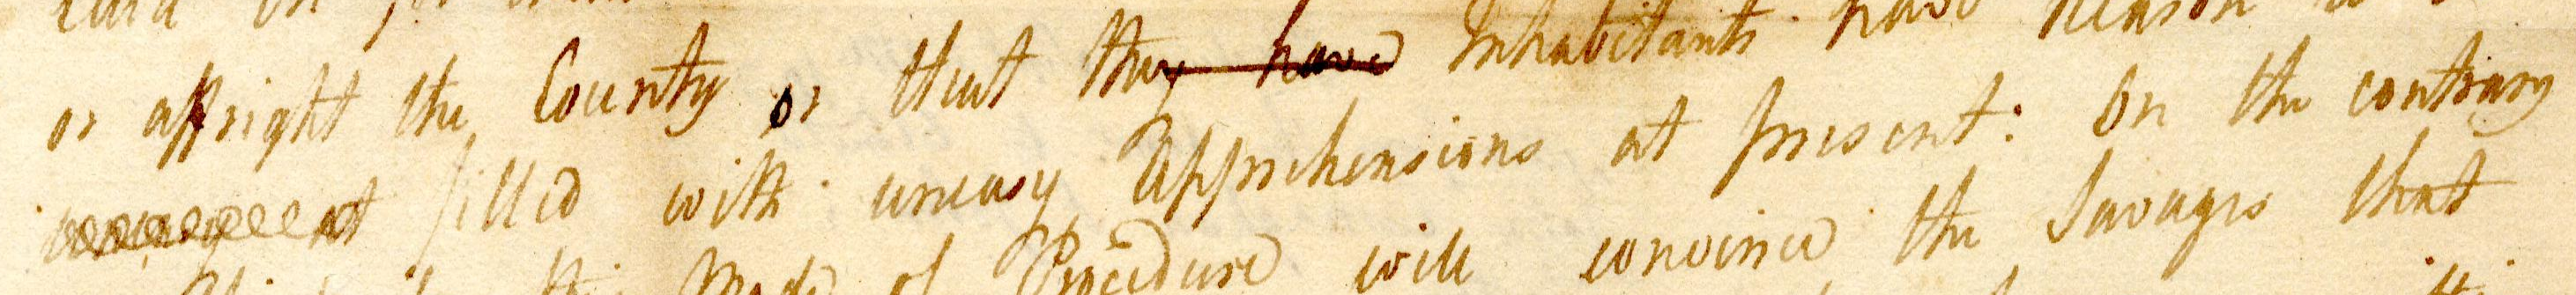[__________] filled with uneasy apprehensions at present: On the contrary
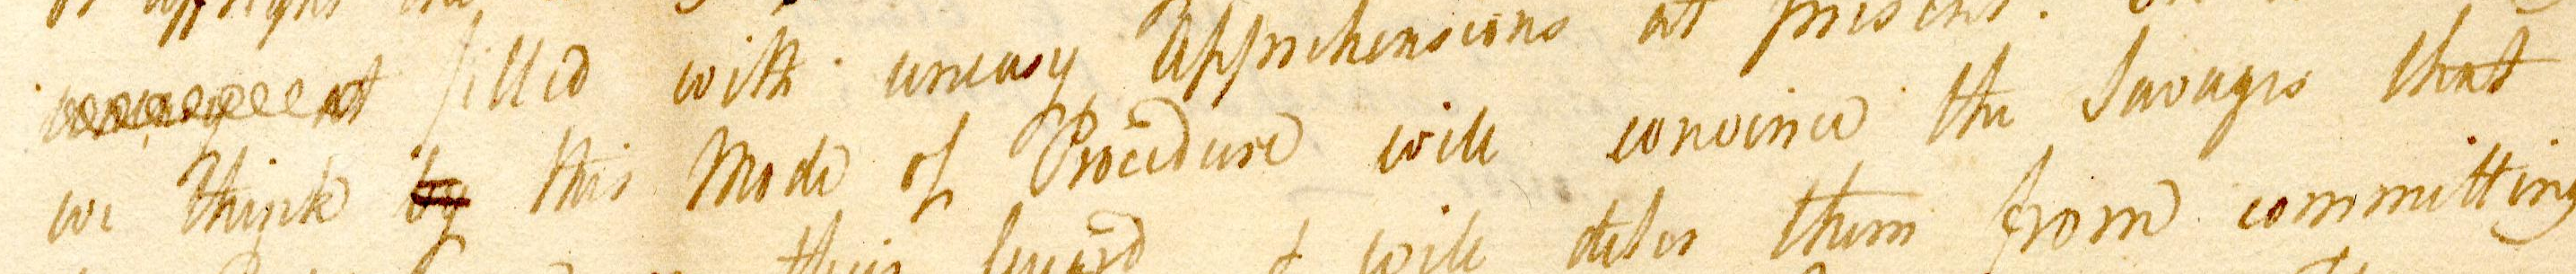we think by this mode of Procedure will convince the Savages that
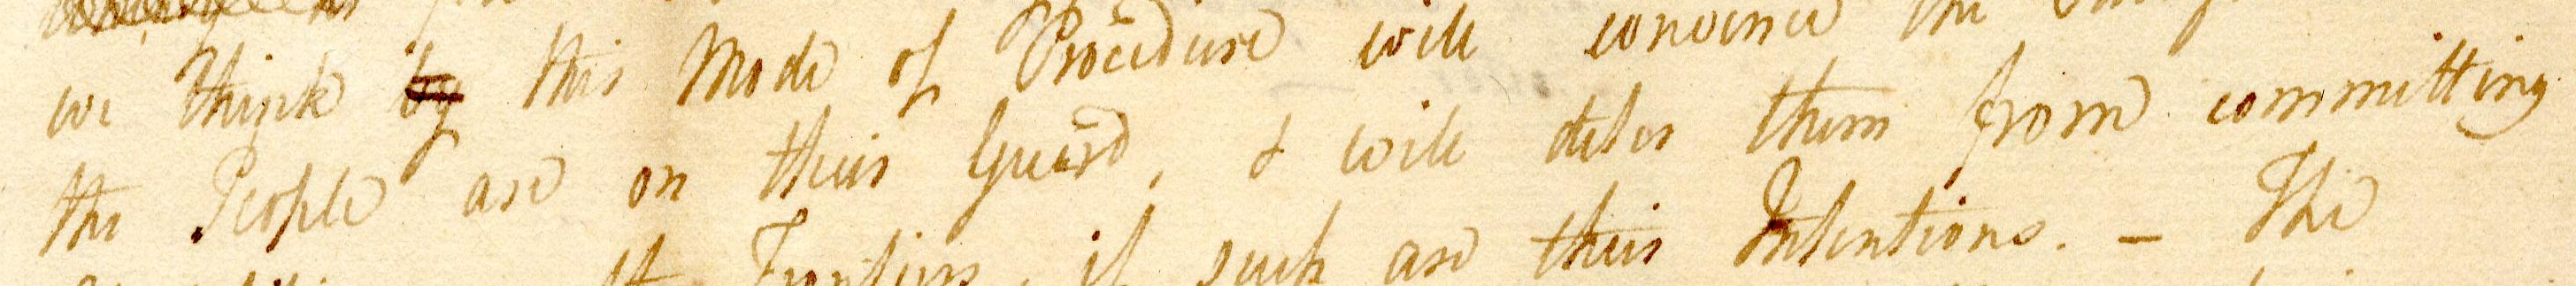the People are on their Guard, & will deter them from committing
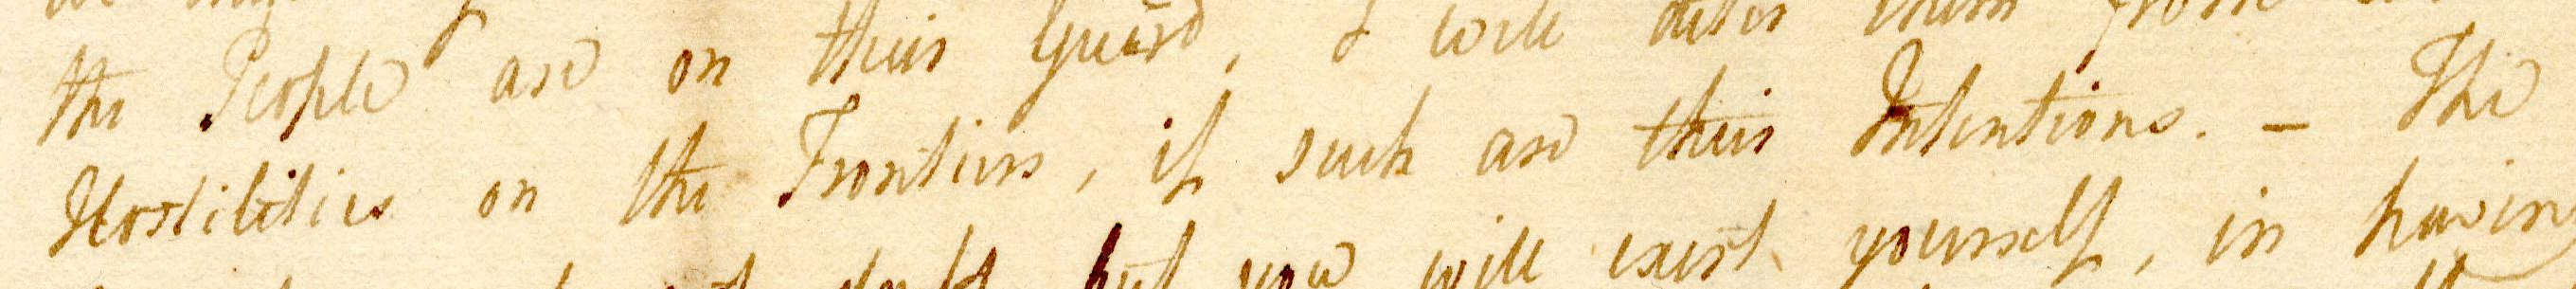Hostilities on the Frontiers, if such are their Intentions.- The
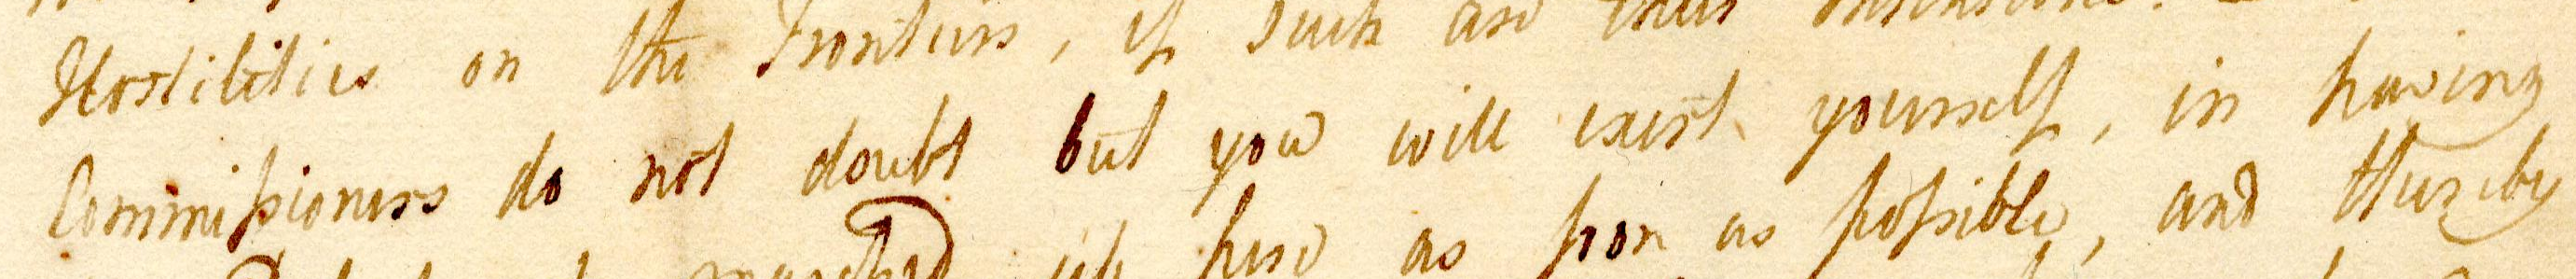Commissioners do not doubt but you will exert yourself, in having
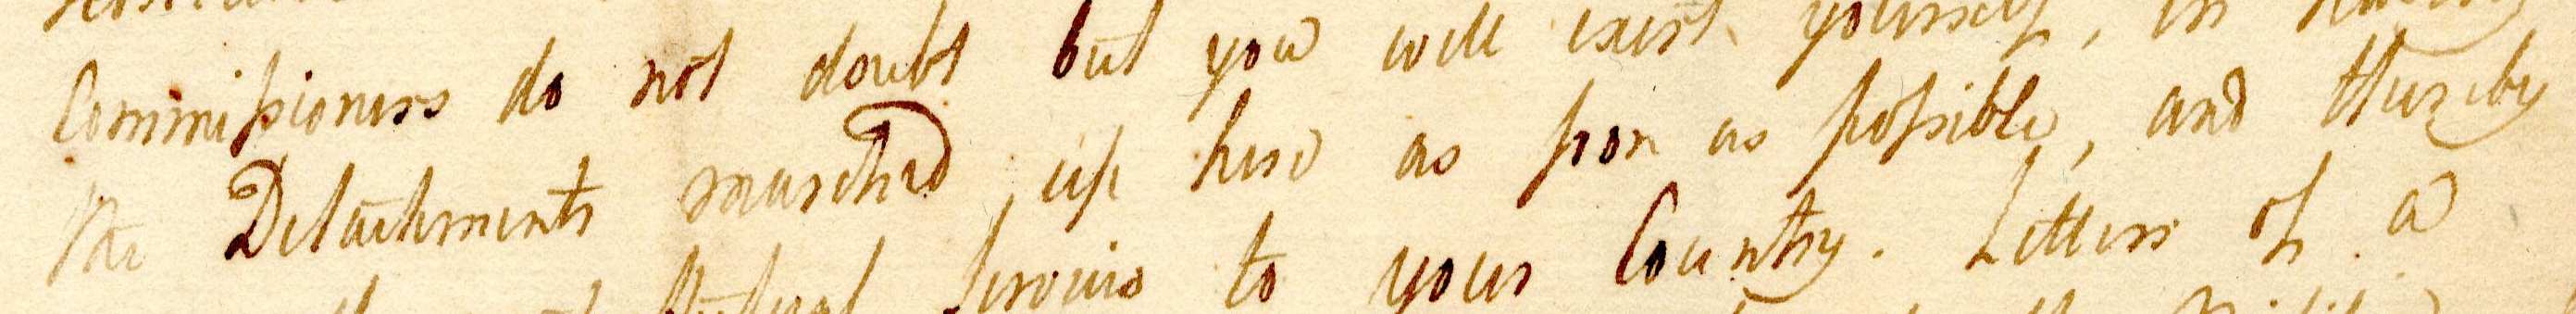the Detachments marched up here as soon as possible, and thereby
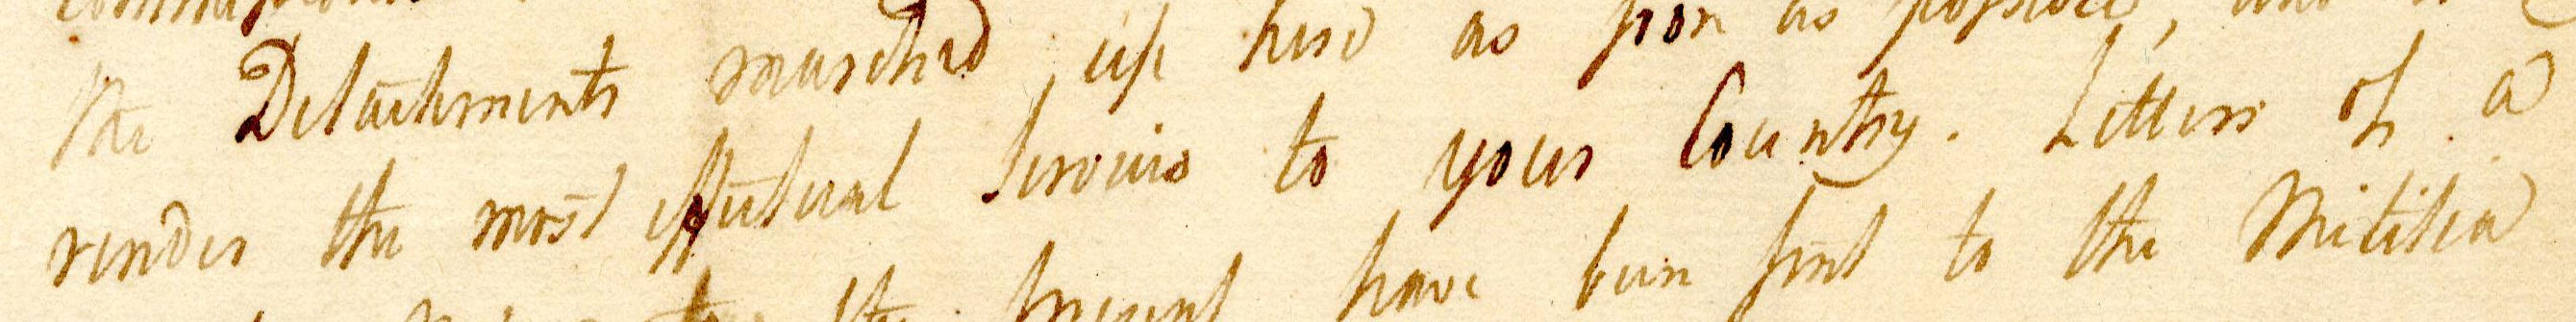render the most effectual Services to your Country. Letters of a
